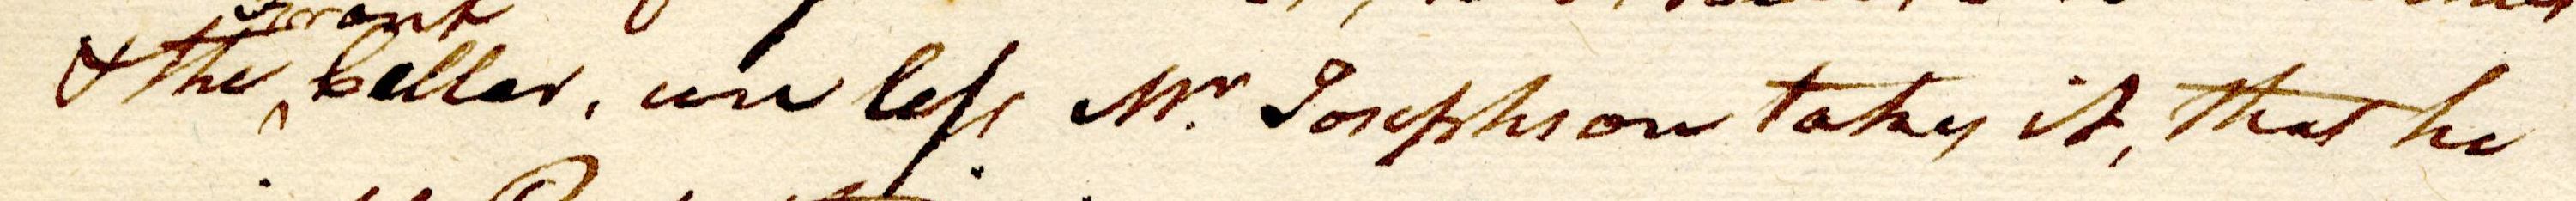& the ^ Caller, unless M^r. Josephson take it, that he
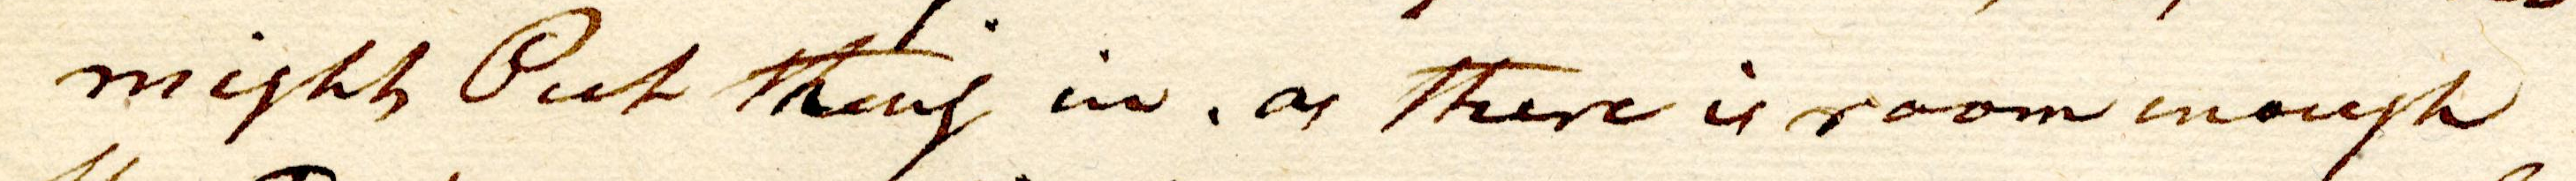might Put thing in as there is room enough
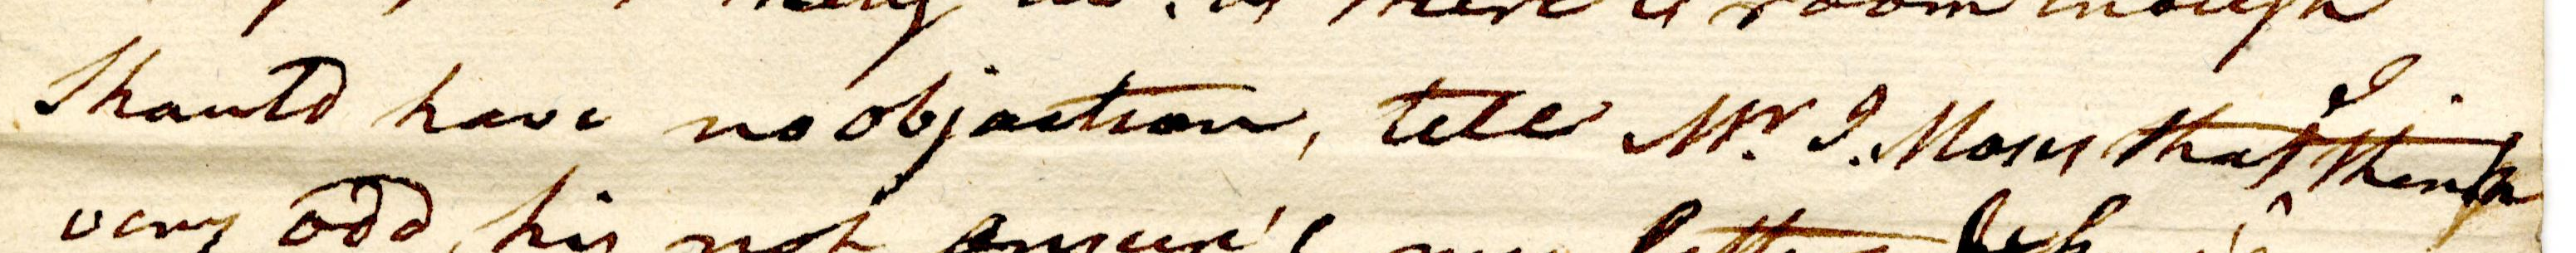should have no objection, tell M^r. I. Moses that ^I think
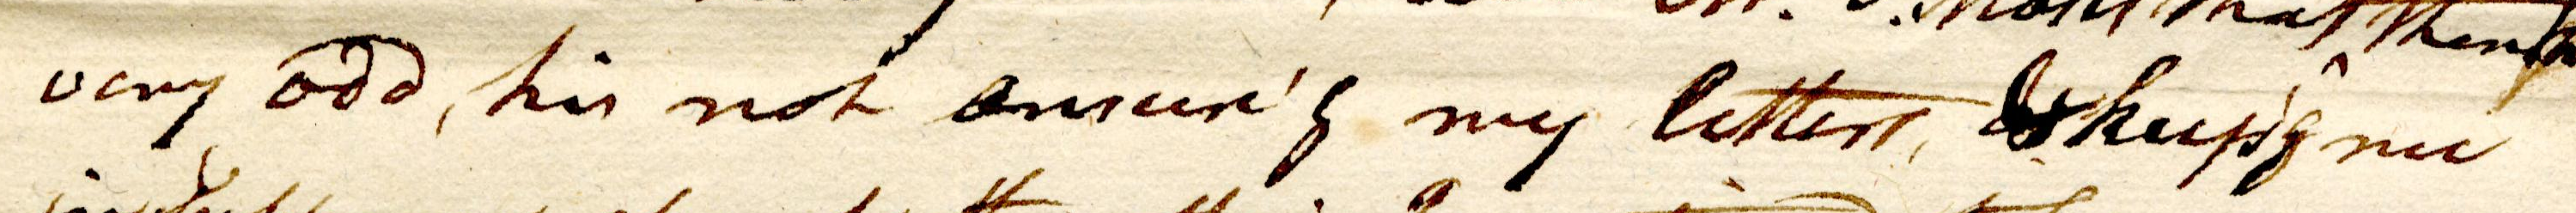very odd, his not answer'g my letters, & keep'g me
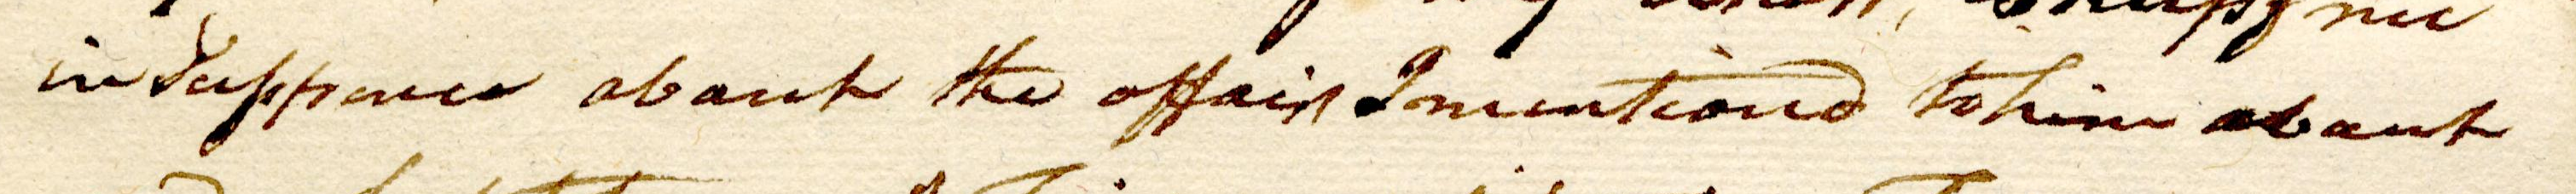in suspance about the affairs I mentioned to him about
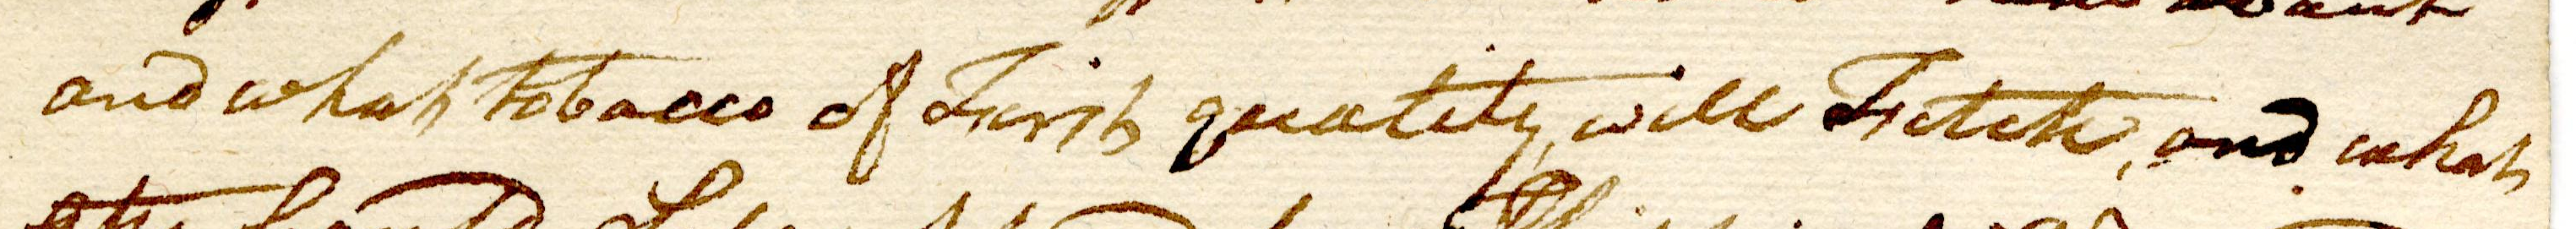and what tobacco of First quantity will fetch and what
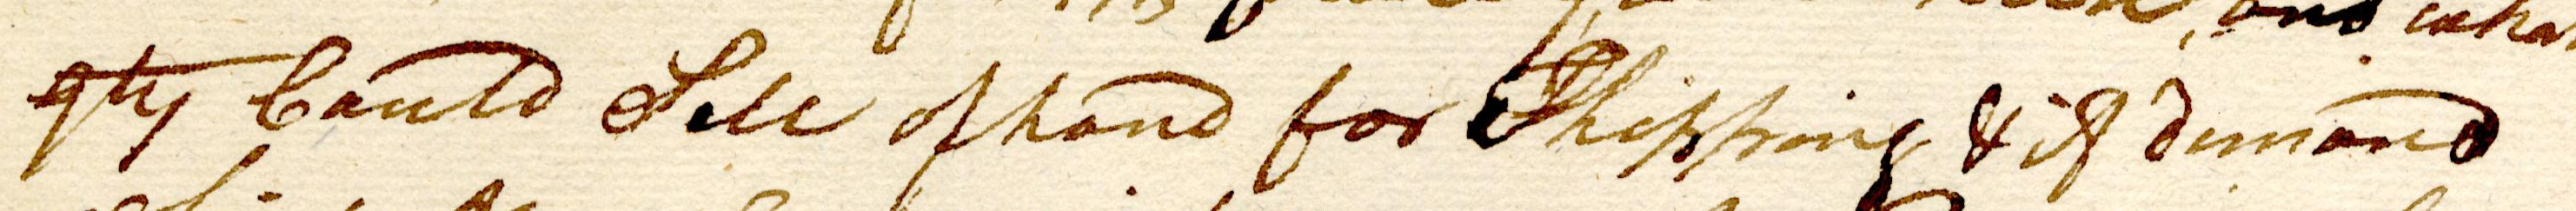qty Could sell of hand for shipping & if demand
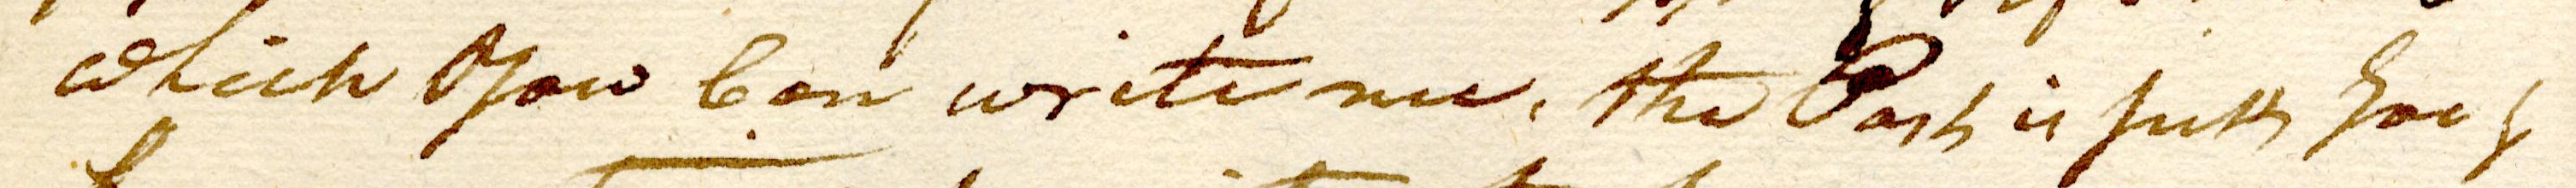which you can write me, the Post is just going
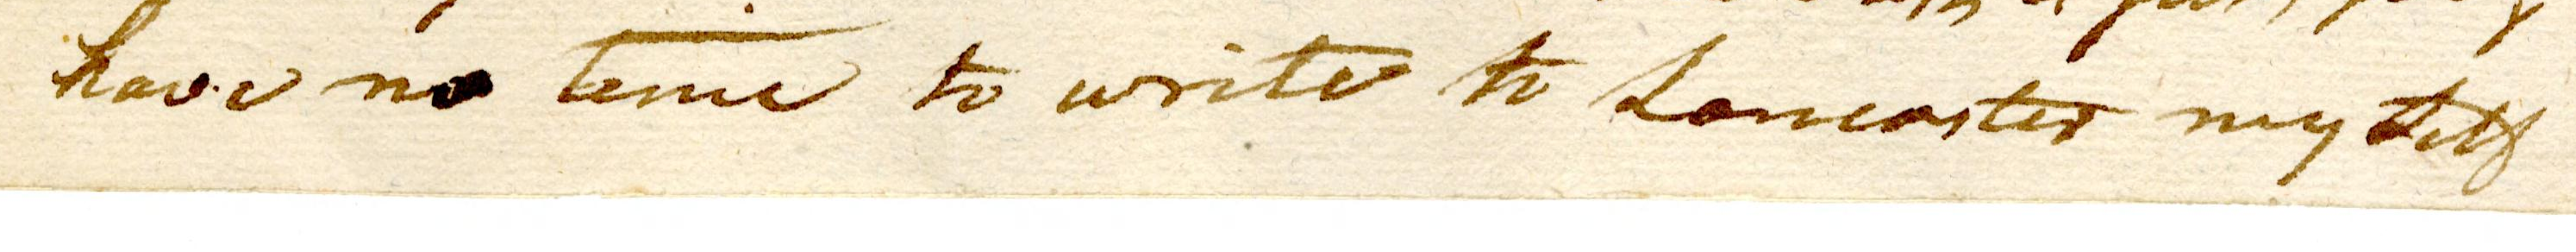have no time to write to Lancaster my self
